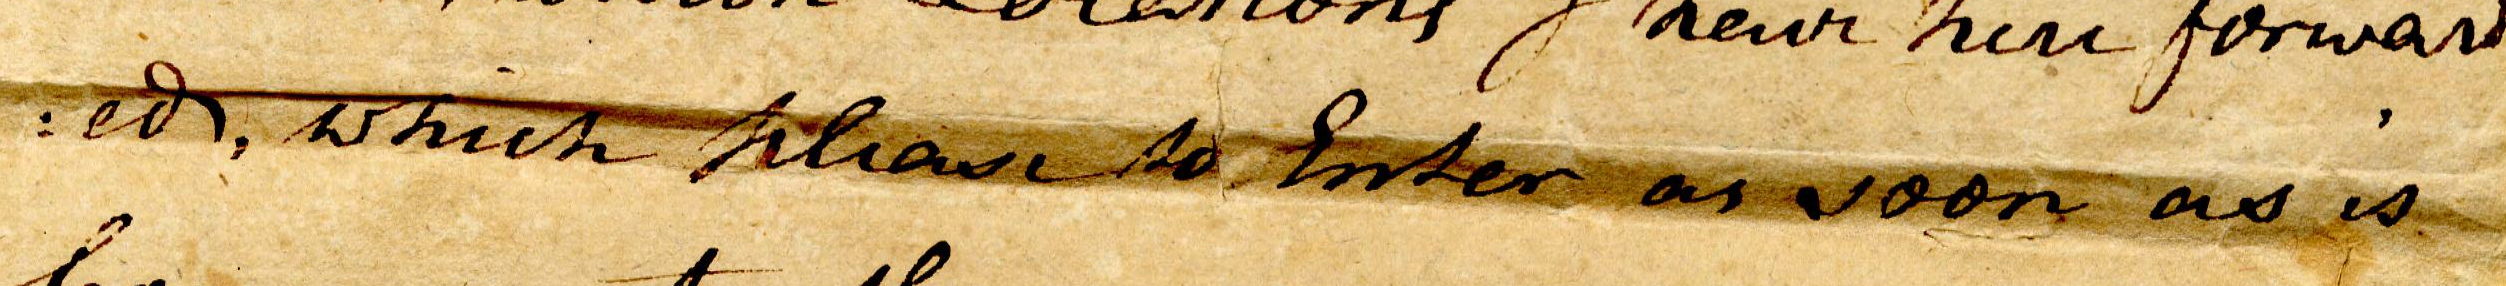-ed, which please to Enter as soon as is
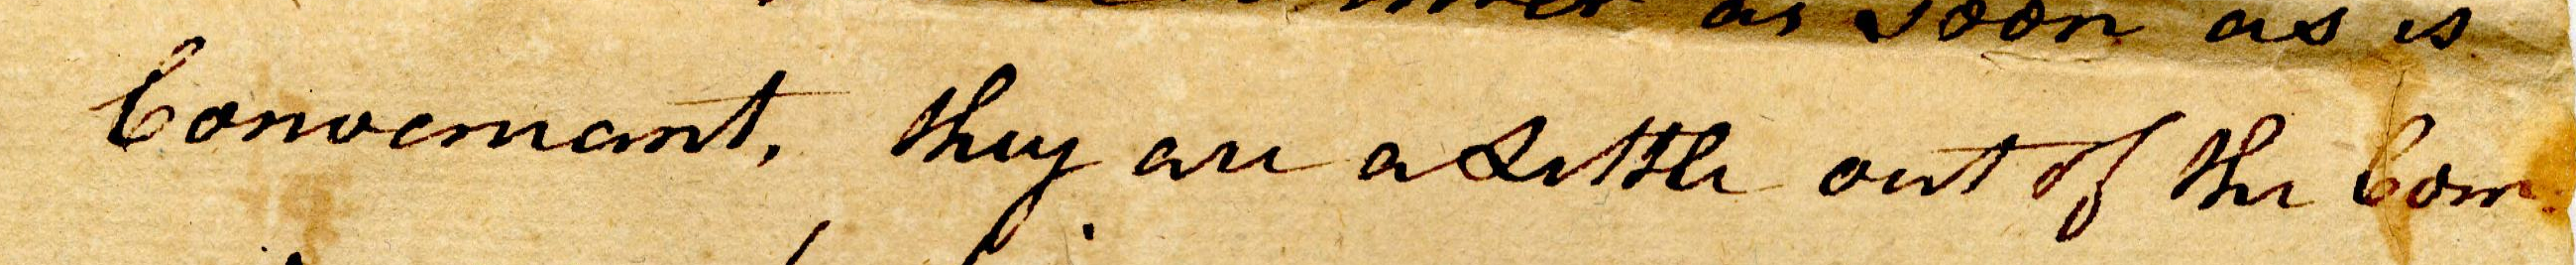Conveniant, they are a Little out of the Com
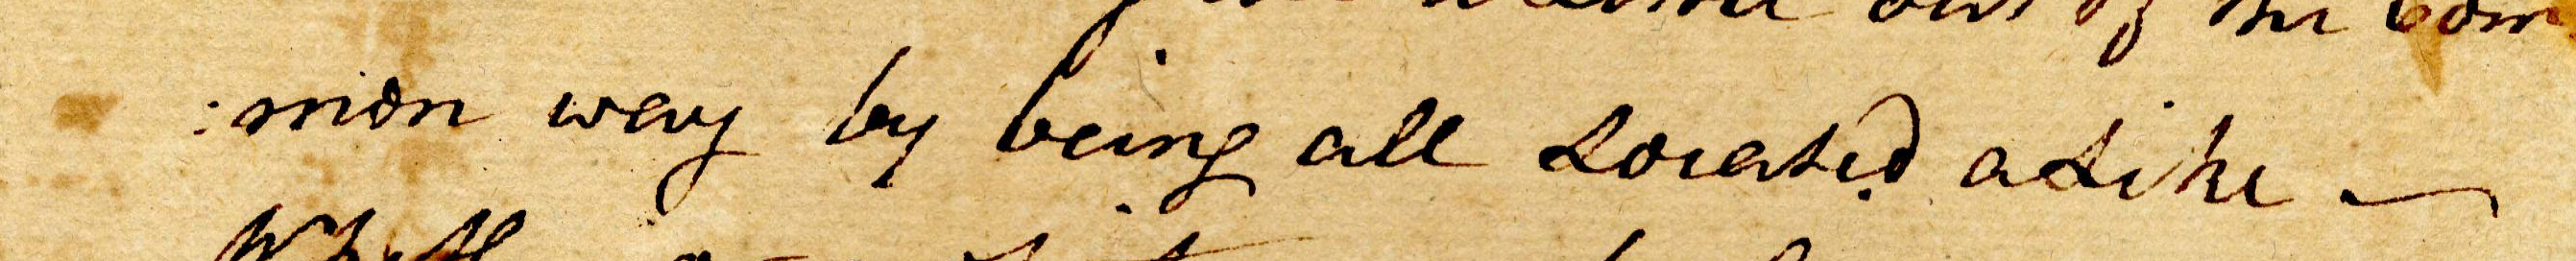-mon way by being all Locat'd a Like-
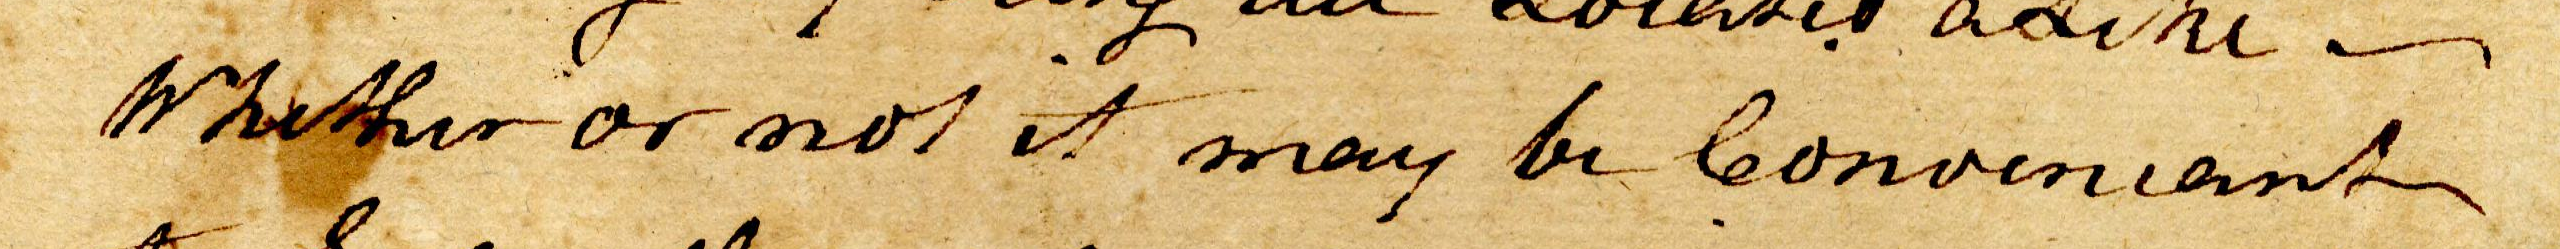Whether or not it may be Conveniant
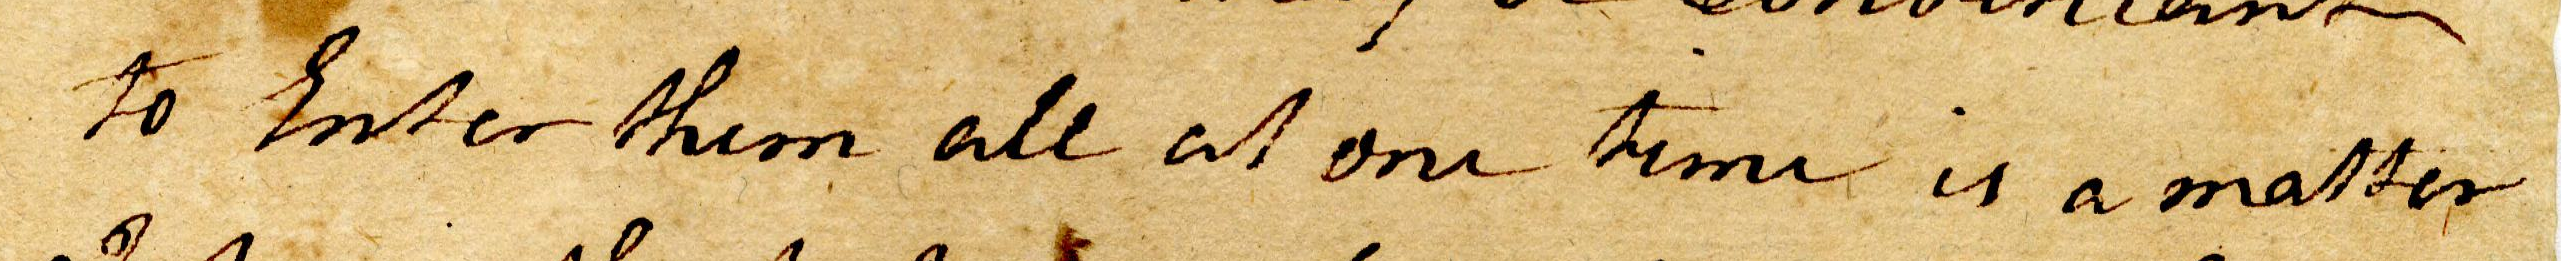to Enter them all at one time is a matter
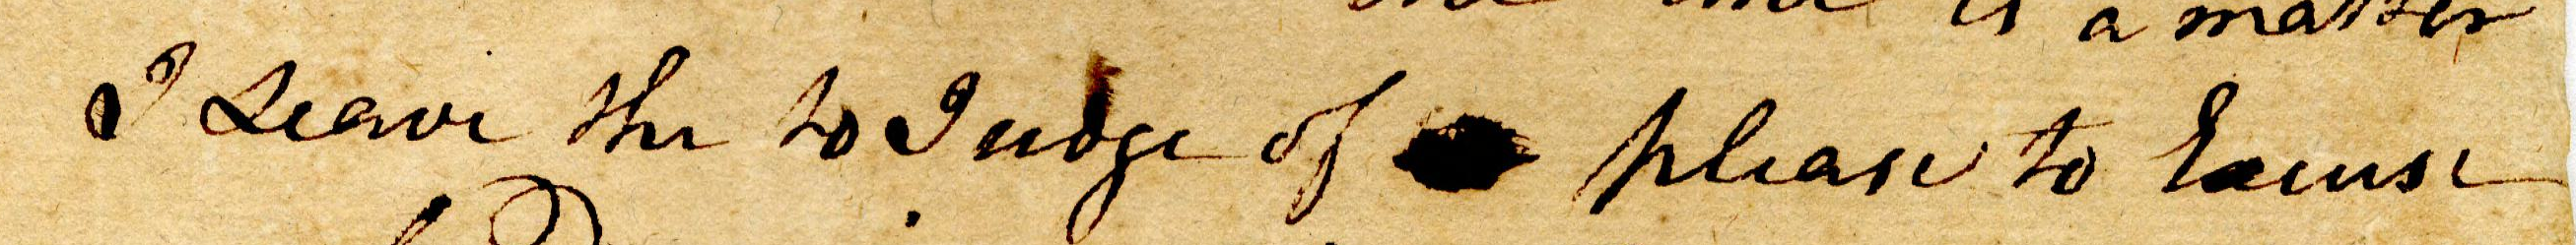I Leave the to Judge of [_] please to Excuse
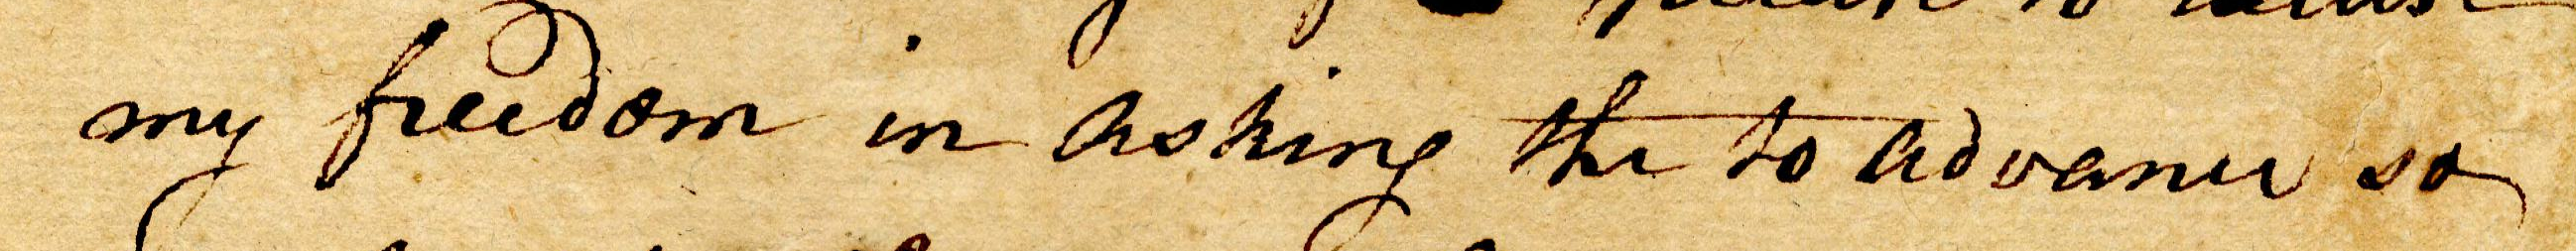my freedom in asking the to advance so
